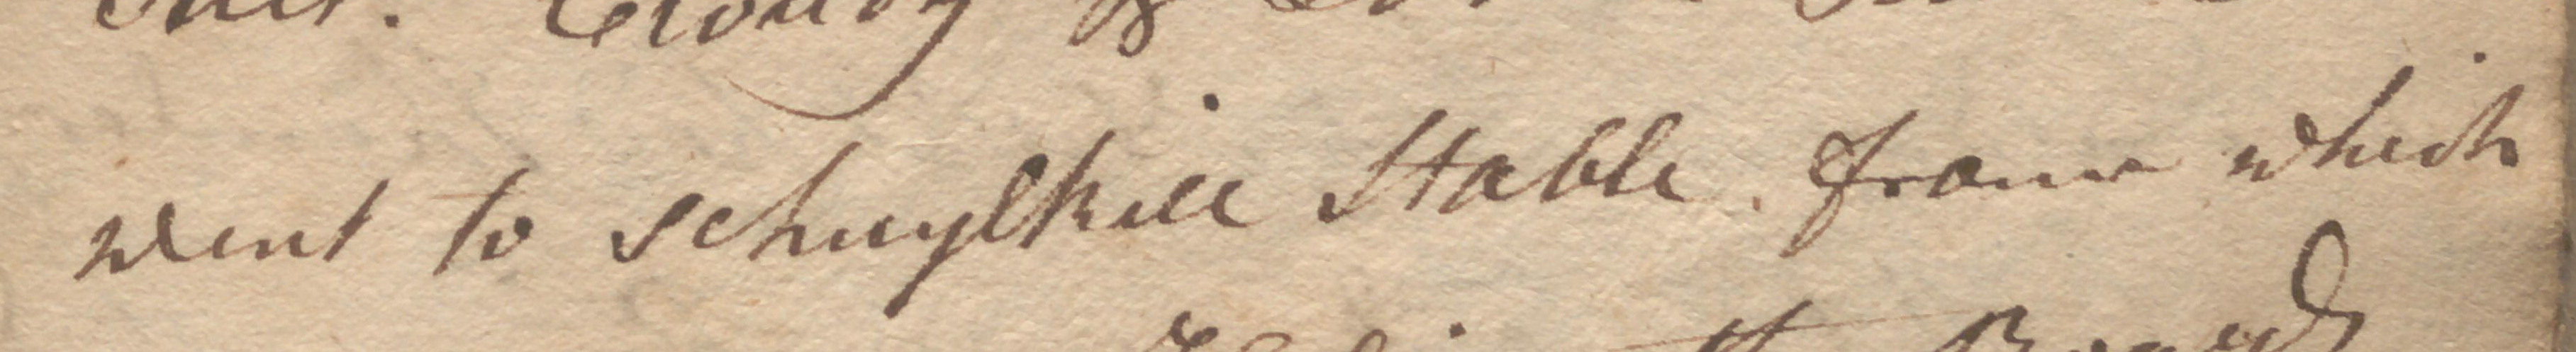went to schuylkill Stable from which
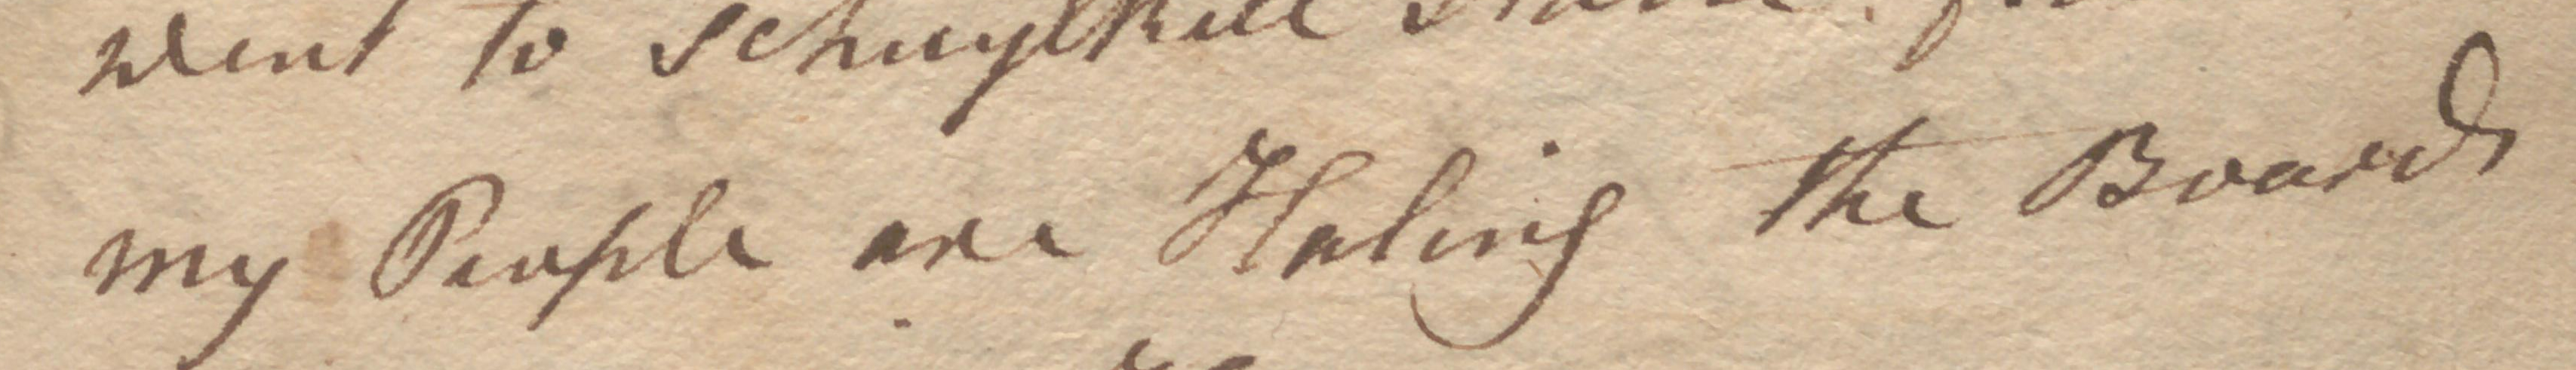my People are Haling the Boards
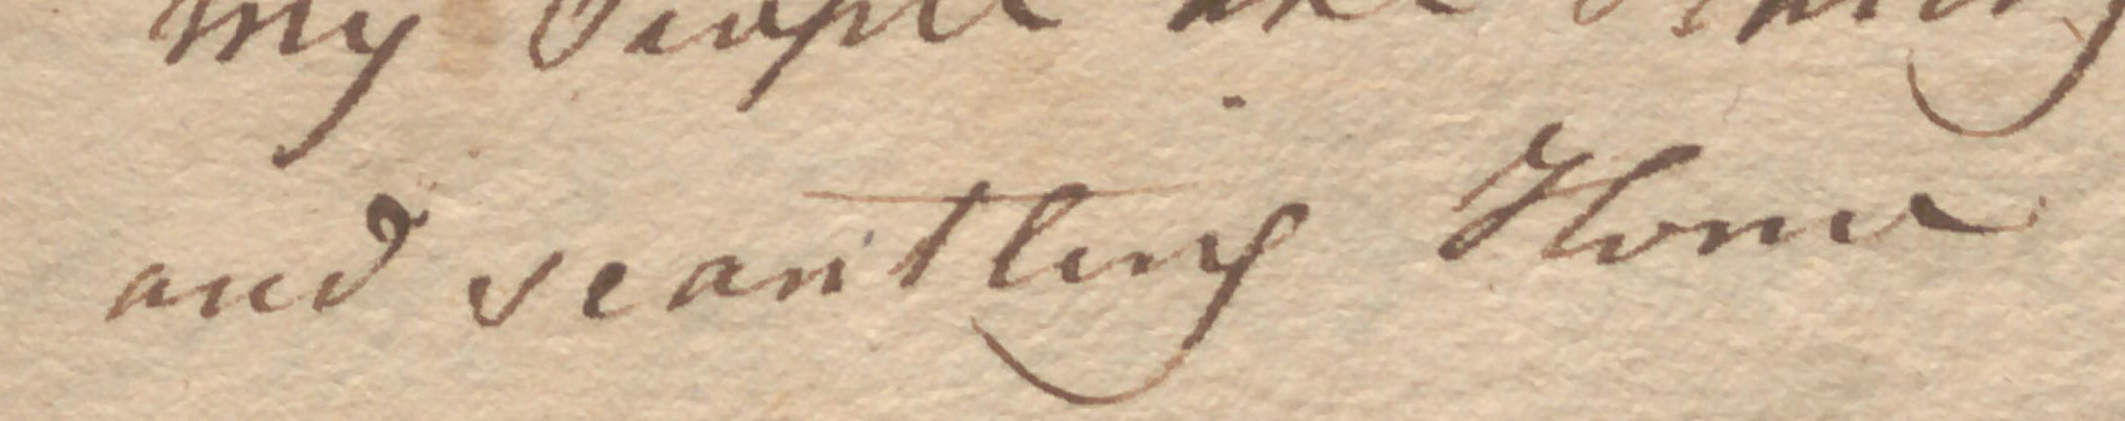and scantling Home
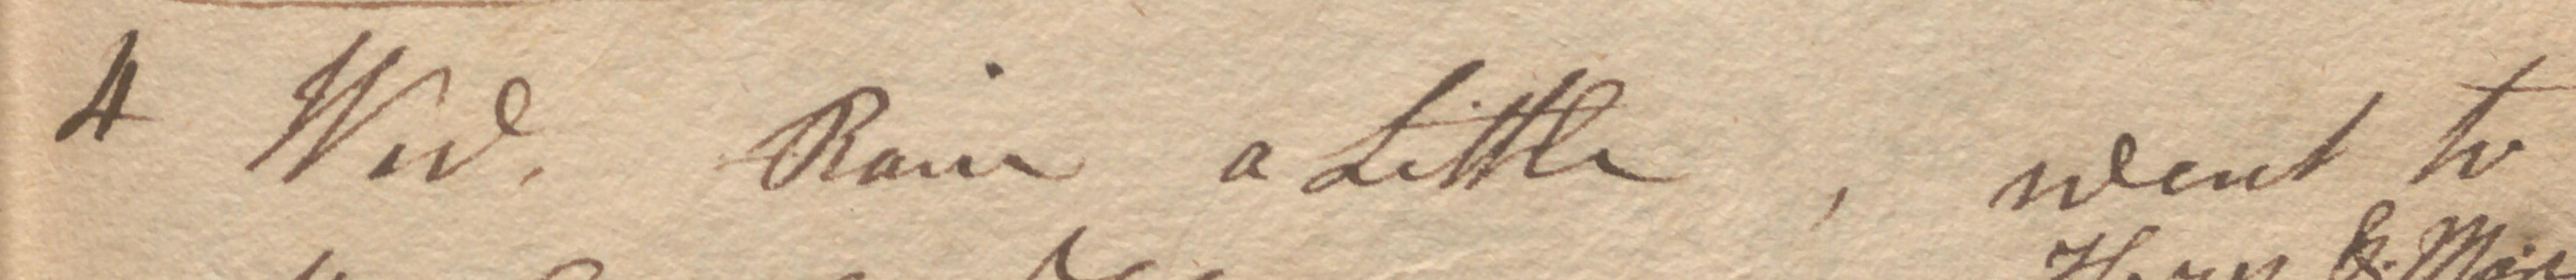4 Wed. Rain a Little, went to
